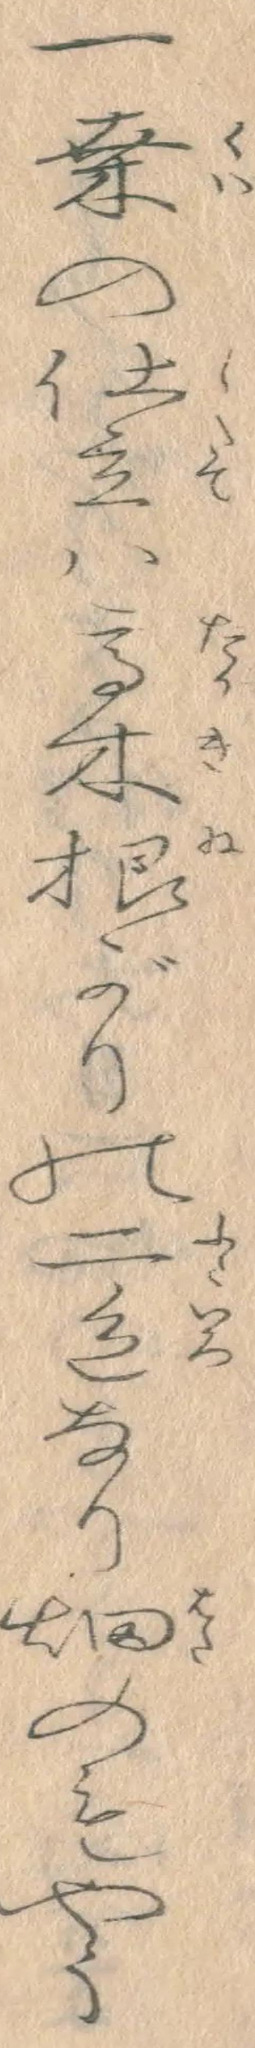一桑の仕立は立木根がりの二色なり畑のもやう
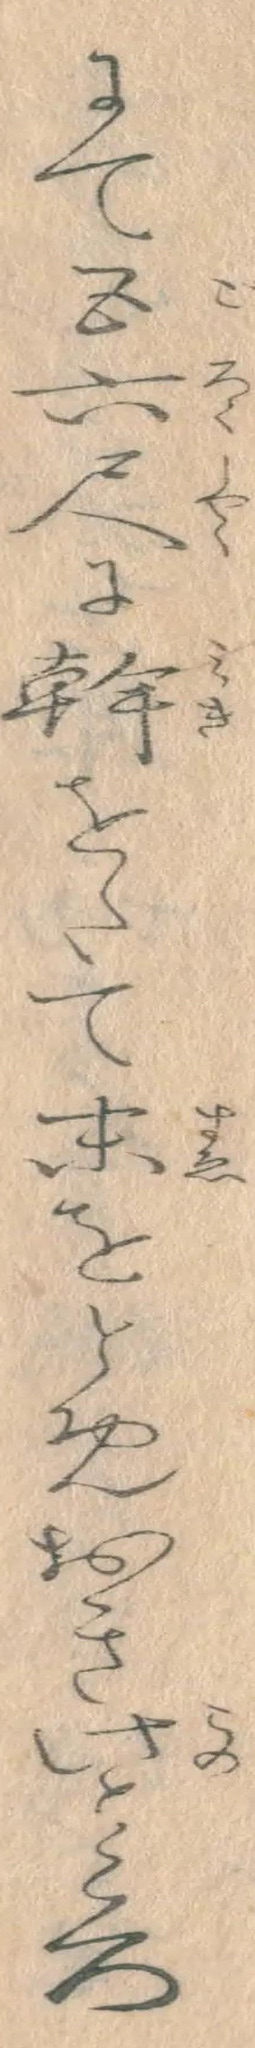にて五六尺に幹をたて末をとめおき此ところ

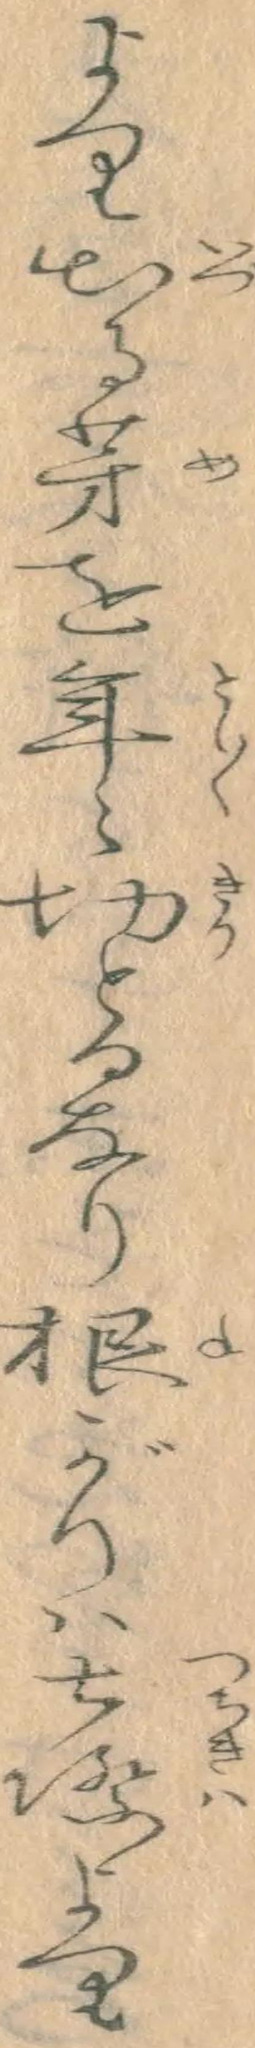より出る芽を年々切とるなり根がりは土際より
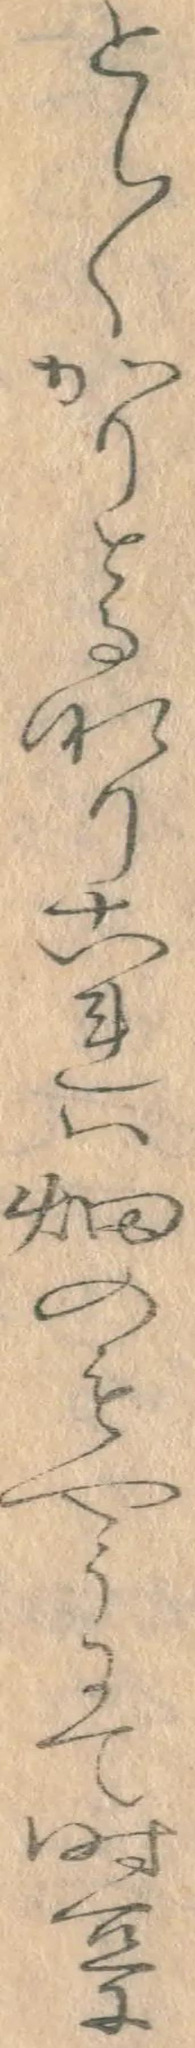とし〳〵かりとるなりこれは畑のもやうにて時宜に
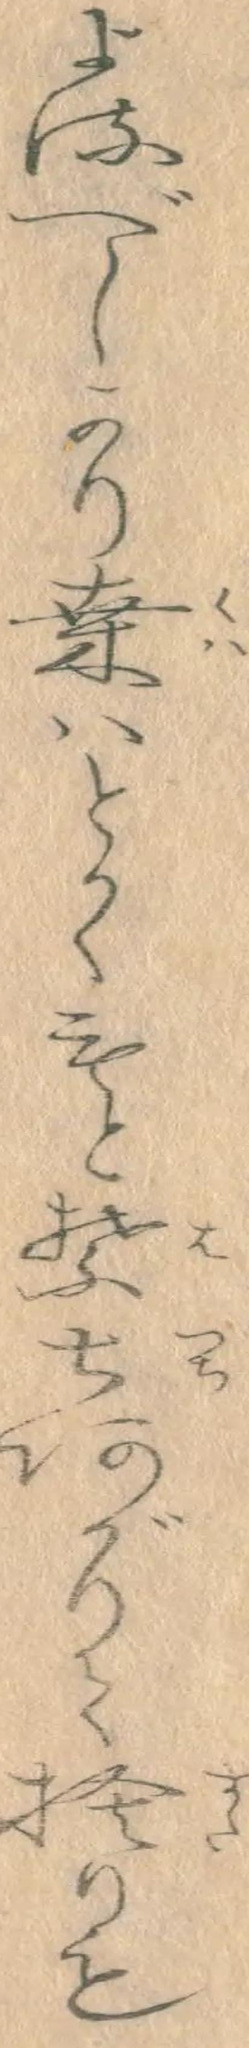よるべしかり桑はとかくもと葉土あがりて捨りも
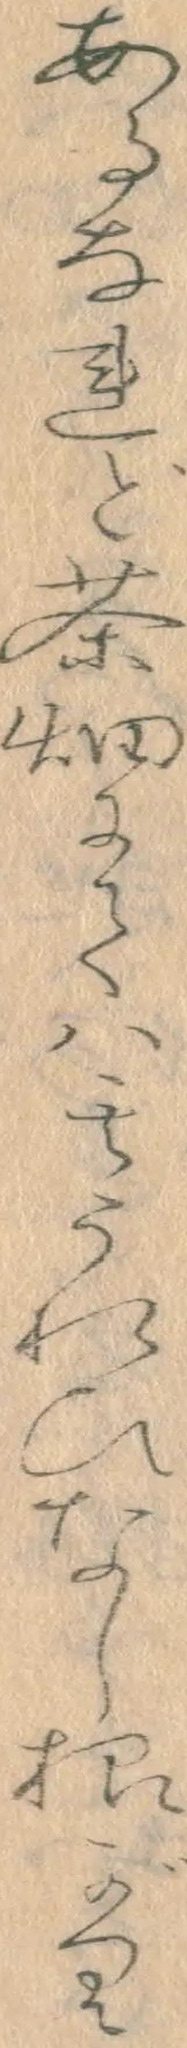あるなれど茶畑にては其うれひなし根がり
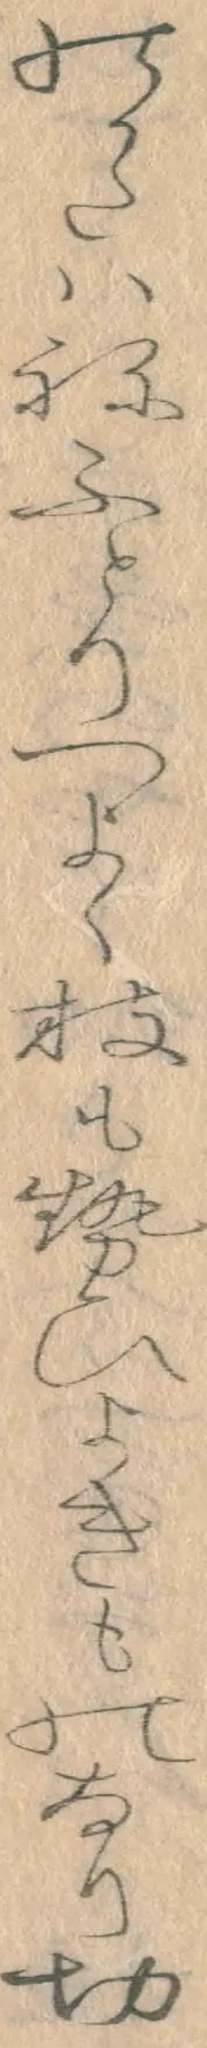のかたはねふとりつよく枝も勢ひよきものなり切
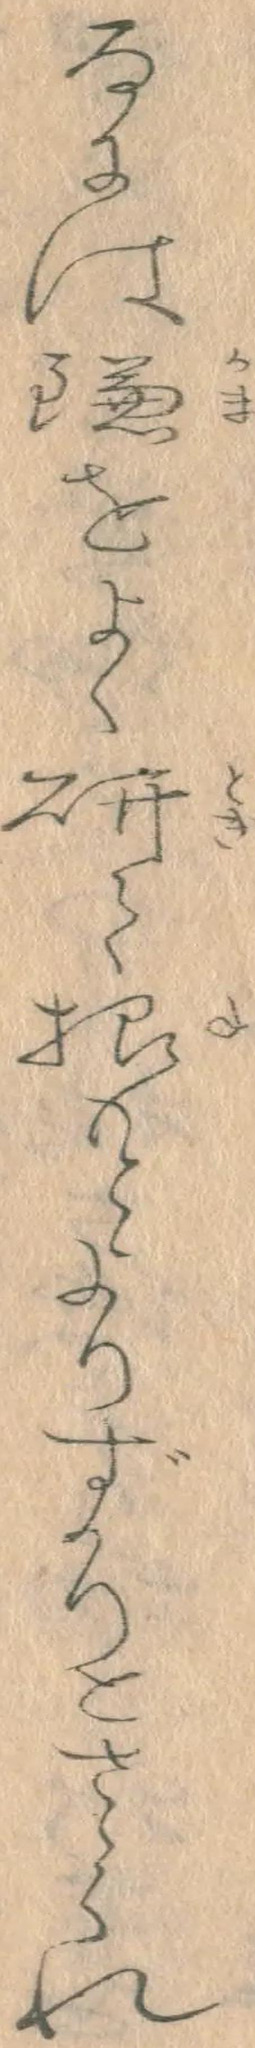るは鎌をよく研て根もとよりずかりとさゝられ
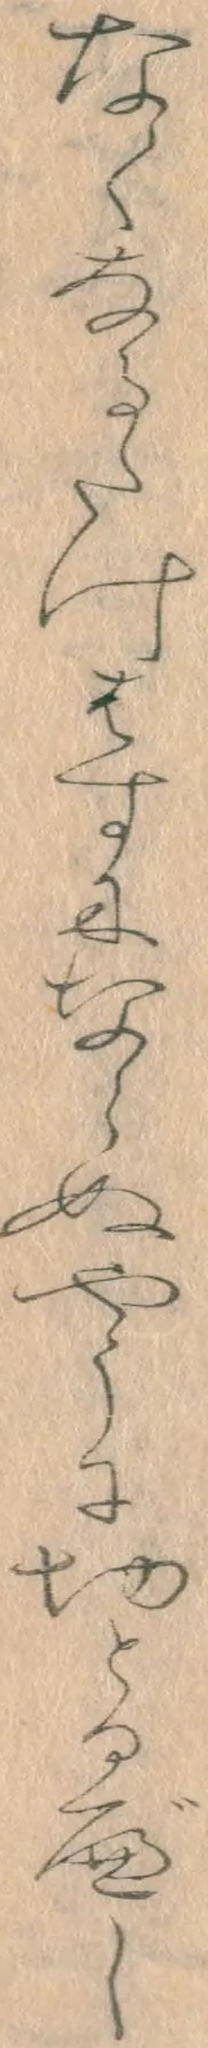なくなるたけはすにならぬやうに切とるべし
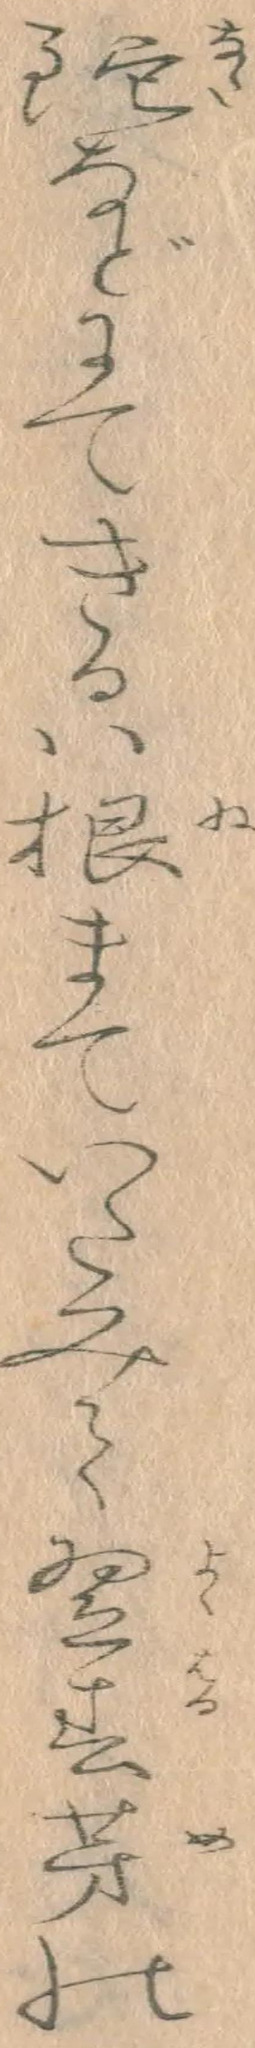鉈などにてきるは根まていたみて翌春芽の
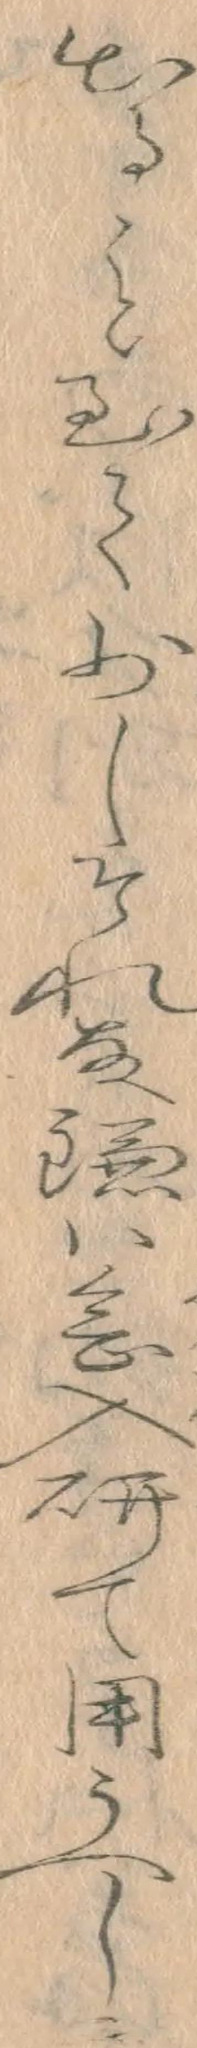出ること至て少しそれゆゑ鎌は念入研て用うへし
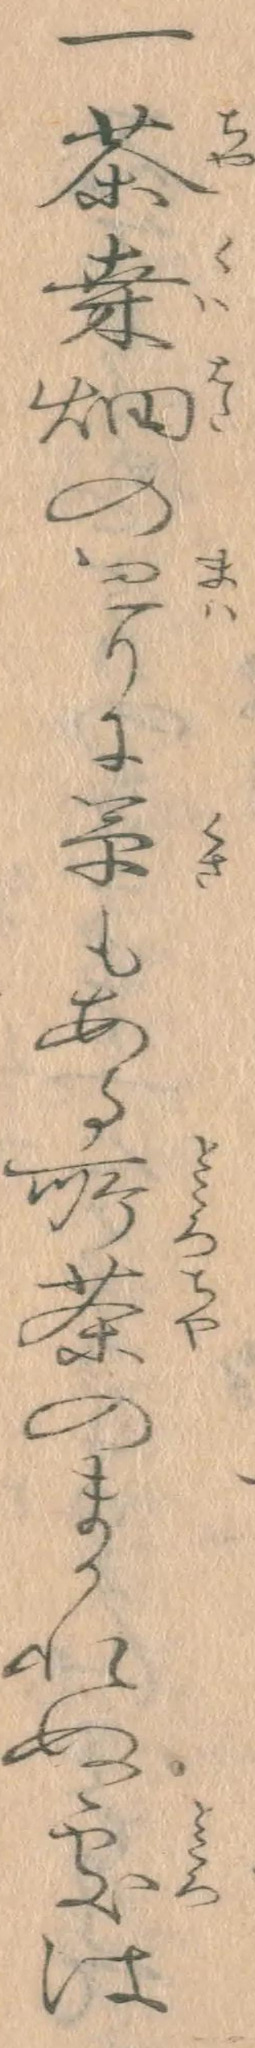一茶桑畑の廻りに草もある所茶のまかれぬ処は
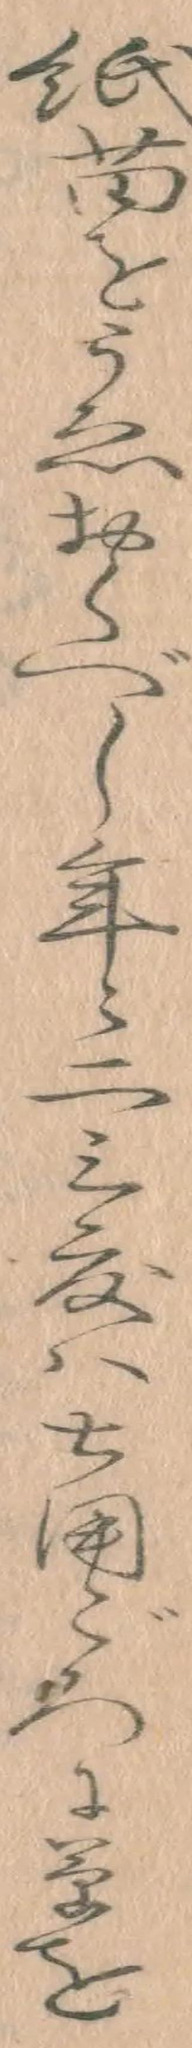紙苗をうゑおくべし年々に二三度は土用ごろに草を
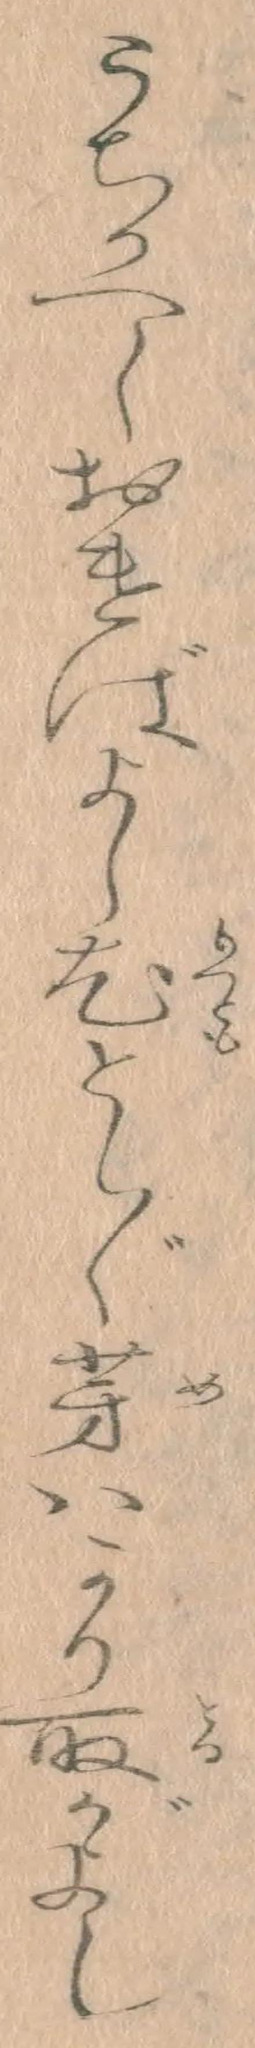うちかへしおけばよし尤とし〴〵芽はかり取がよし
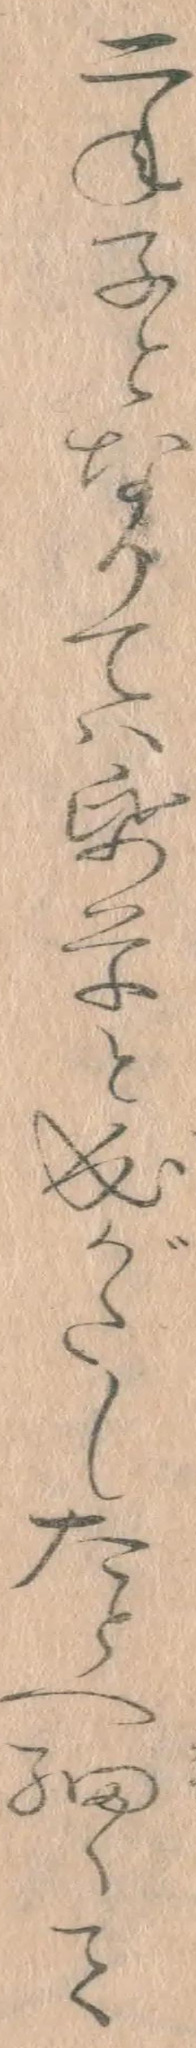二年子となりては紙草と成がたしたとへ細くて
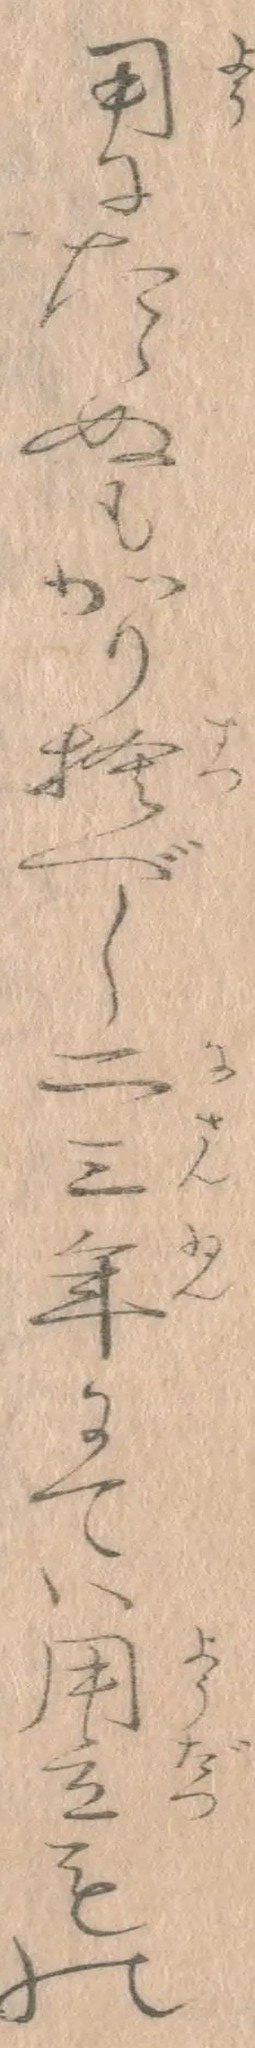用にたらぬもかり捨べし二三年にては用立もの
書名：蚕茶并紙木植方書
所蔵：国立国会図書館 National Diet Library, JAPAN
